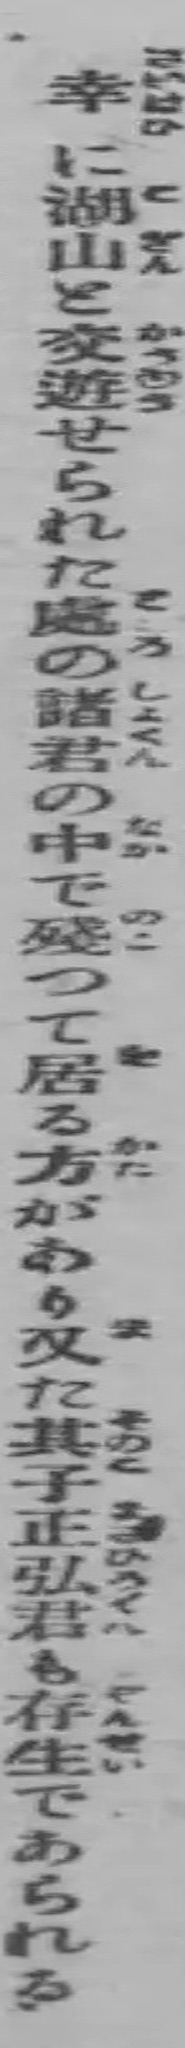幸に湖山と交遊せられた処の諸君の中で残つて居る方があり又た其子正弘君も存生であられる
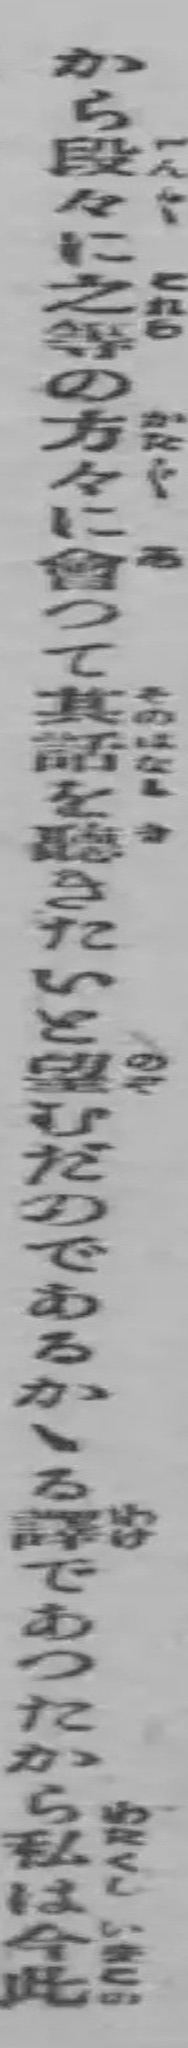から段々に之等の方々に会つて其話を聴きたいと望むだのであるかゝる訳であつたから私は今此
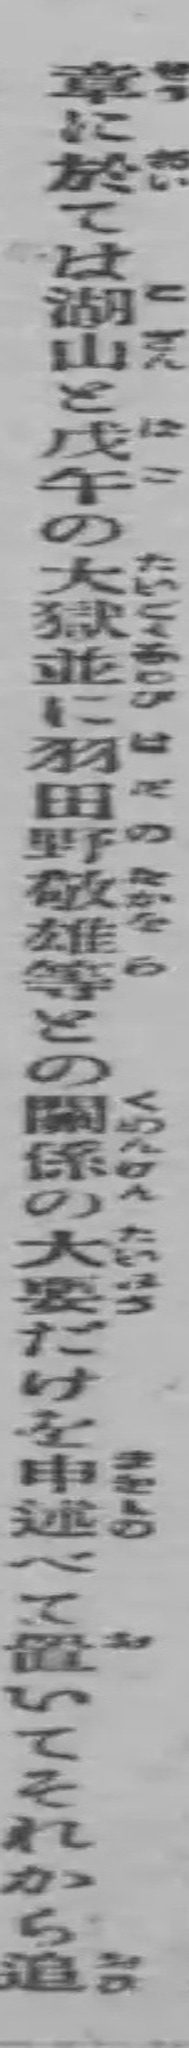章に於ては湖山と戊午の大獄並に羽田野敬雄等との関係の大要だけを申述べて置いてそれから追
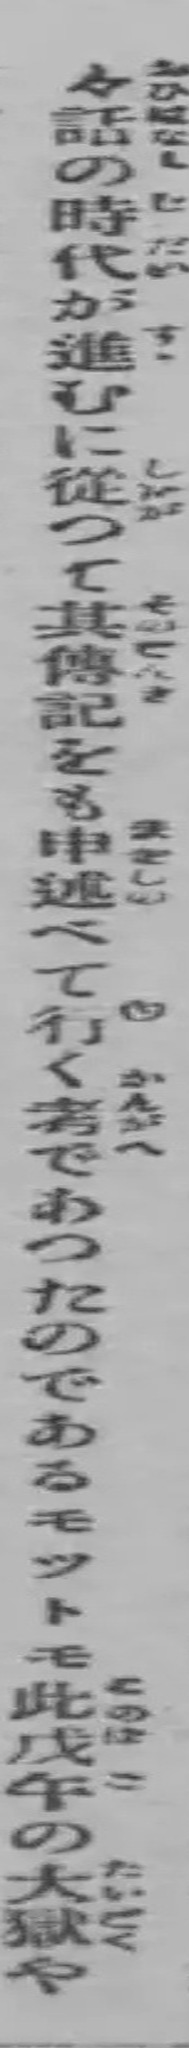追話の時代が進むに従つて其伝記をも申述べて行く考であつたのであるモツトモ此戊午の大獄や
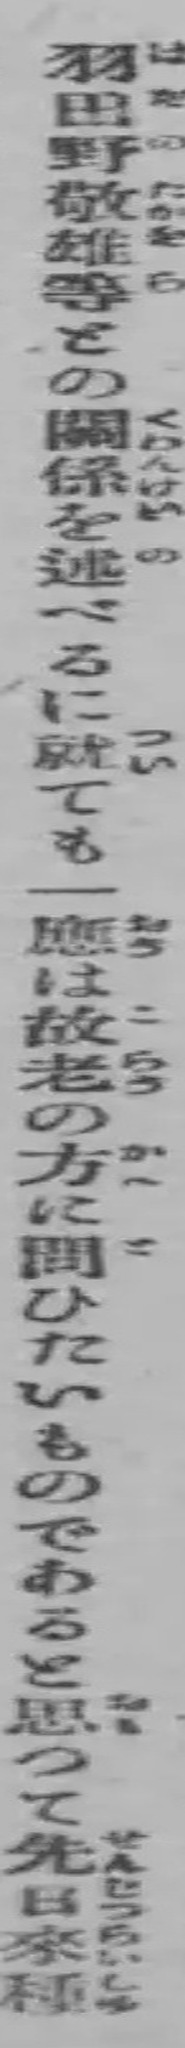羽田野敬雄等との関係を述べるに就ても一応は故老の方に問ひたいものであると思つて先日来種
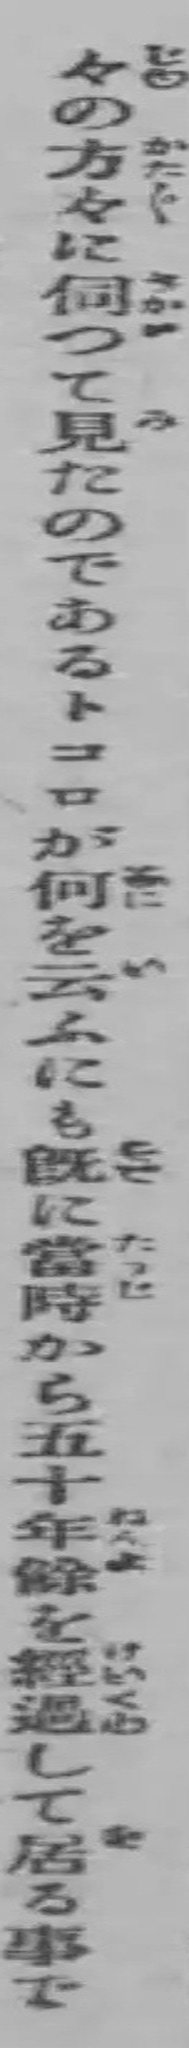種の方々に伺つて見たのであるトコロが何を云ふにも既に当時から五十年余を経過して居る事で
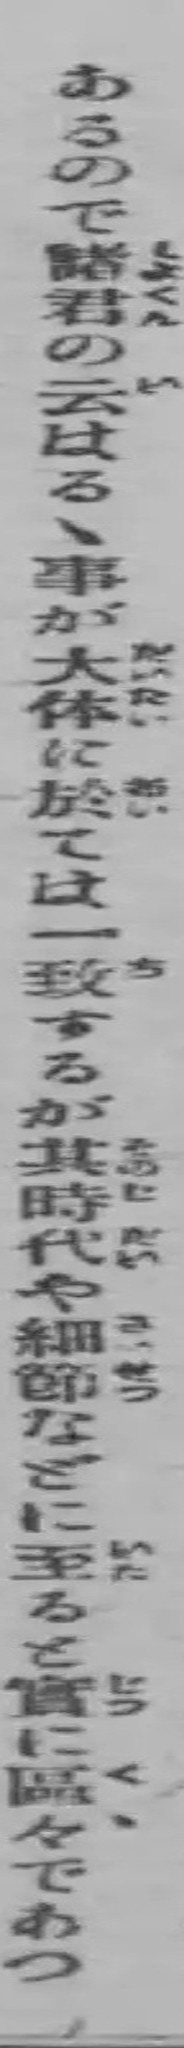あるので諸君の云はるゝ事が大体に於ては一致するが其時代や細節などに至ると実に区々であつ
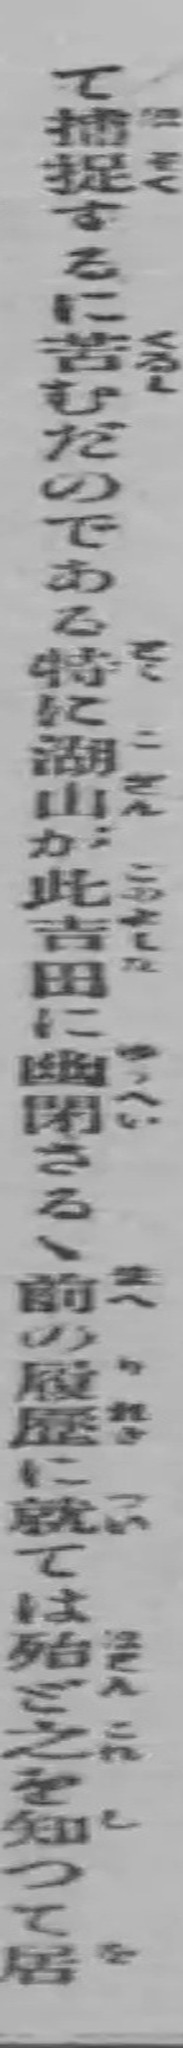て捕捉するに苦むだのである特に湖山が此吉田に幽閉さるゝ前の履歴に就ては殆ど之を知つて居
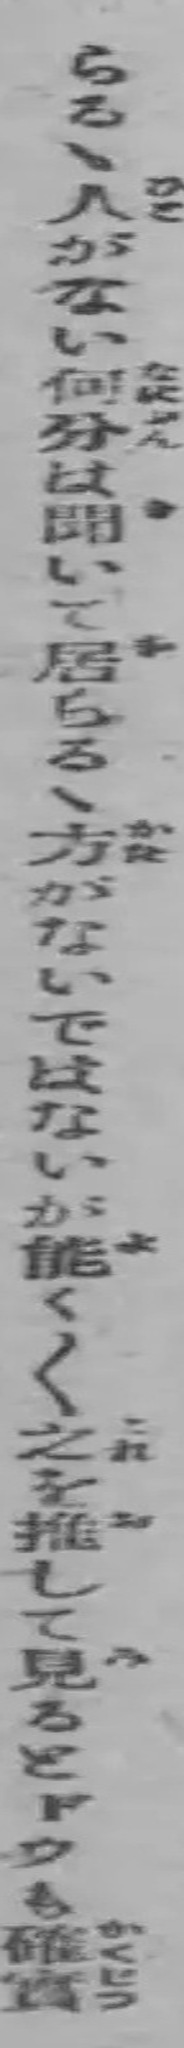らるゝ人がない何分は聞いて居らるゝ方がなにではないが能く〳〵之を推して見るとドウも確実

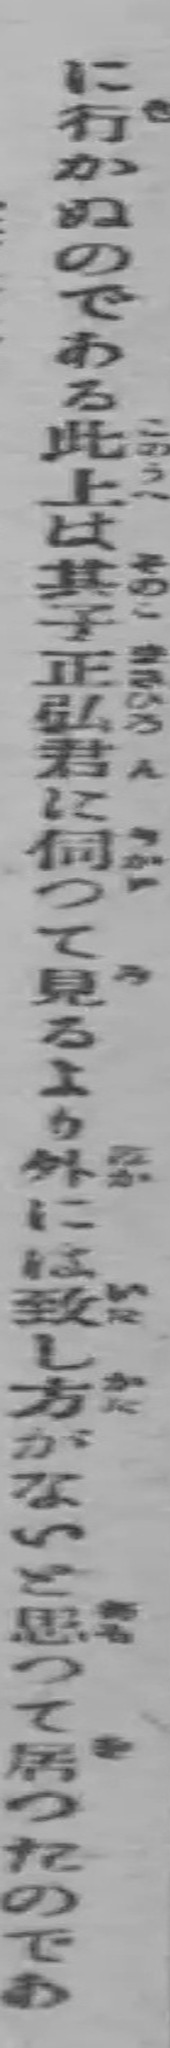に行かぬのである此上は其子正弘君に伺つて見るより外には致し方がないと思つて居つたのであ
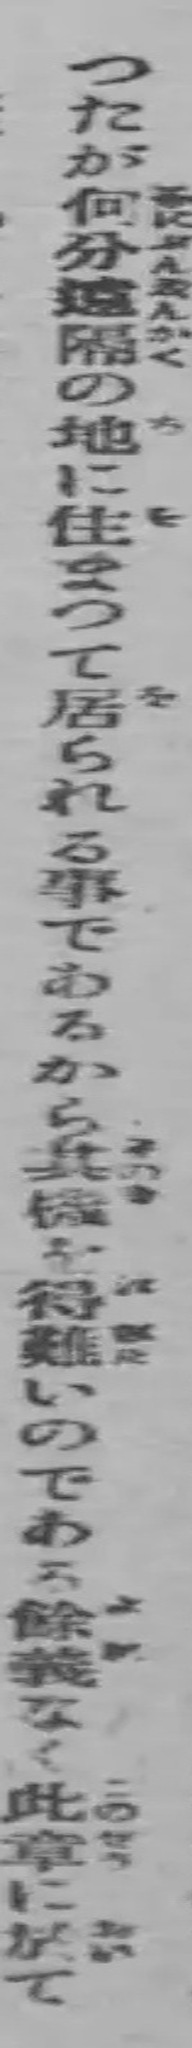つたが何分遠隔の地に住まつて居られる事であるから其機を得難いのである余義なく此章に於て
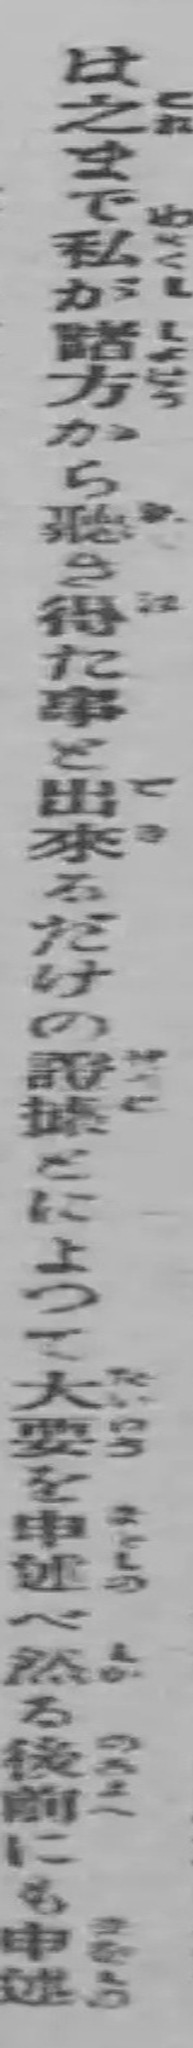は之まで私が諸方から聴き得た事と出来るだけの証拠とによつて大要を申述べ然る後前にも申述
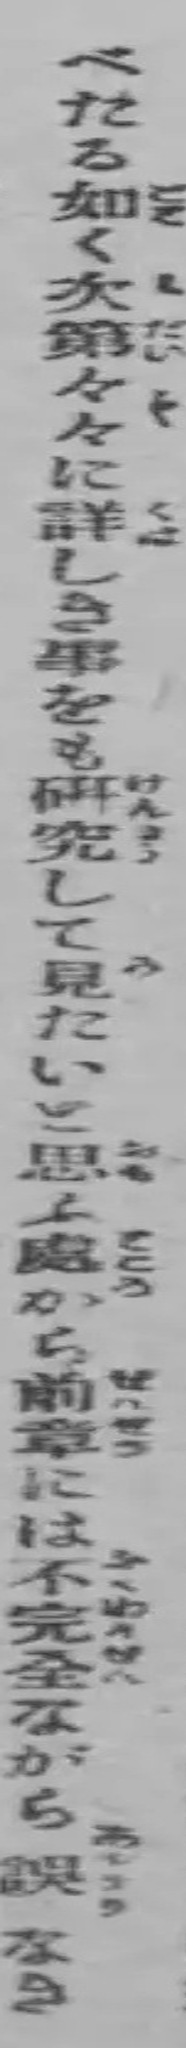べたる如く次第々々に詳しき事をも研究して見たいと思ふ処から前章には不完全ながら誤なき
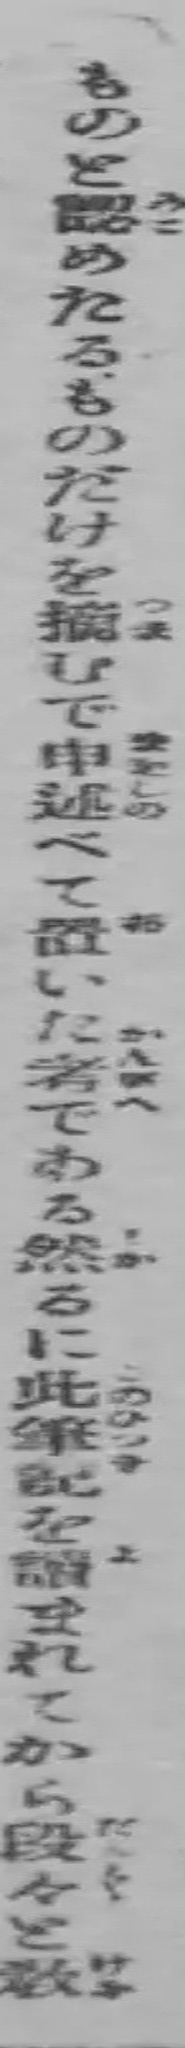ものと認めたるものだけを摘むで申述べて置いた考である然るに此筆記を読まれてから段々と教
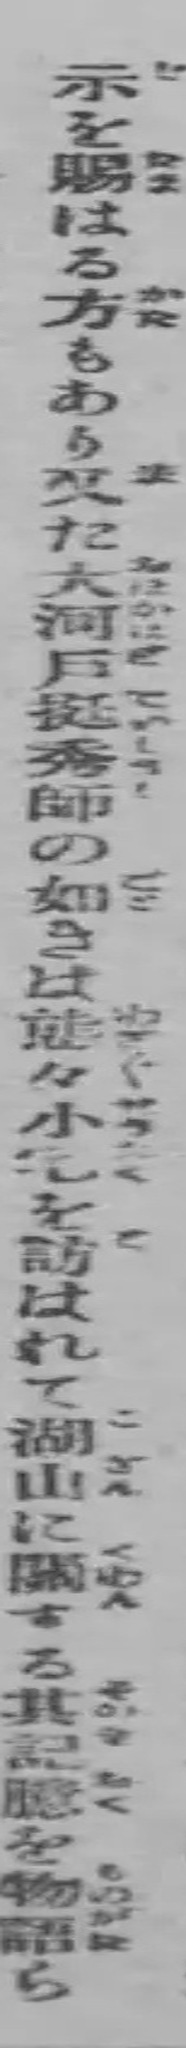示を賜はる方もあり又た大河戸挺秀師の如きは態々小宅を訪はれて湖山に関する其記憶を物語ら
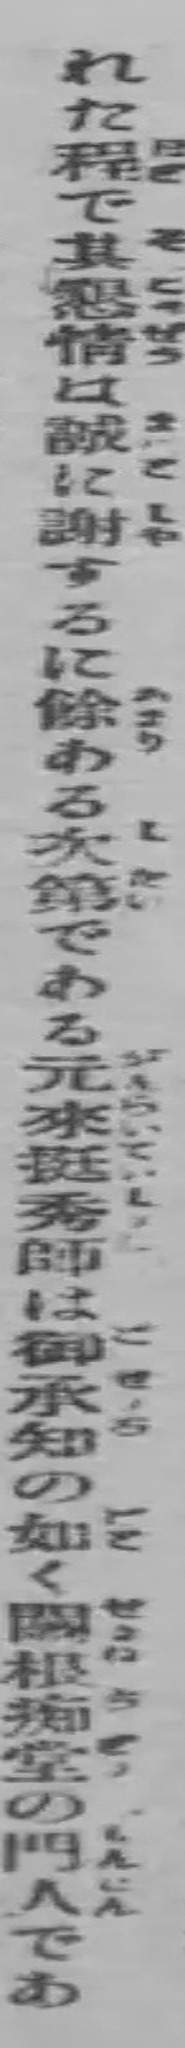れた程で其懇情は誠に謝するに余ある次第である元来挺秀師は御承知の如く関根痴堂の門人であ
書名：豊橋市史談
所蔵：国立国会図書館 National Diet Library, JAPAN
